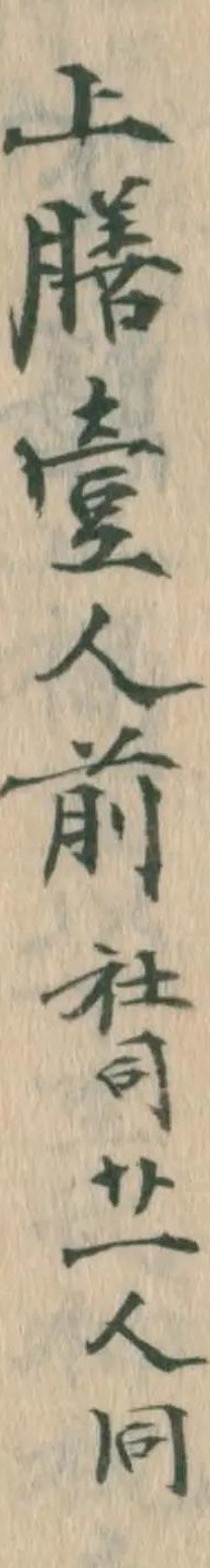上膳壱人前社司廿一人同

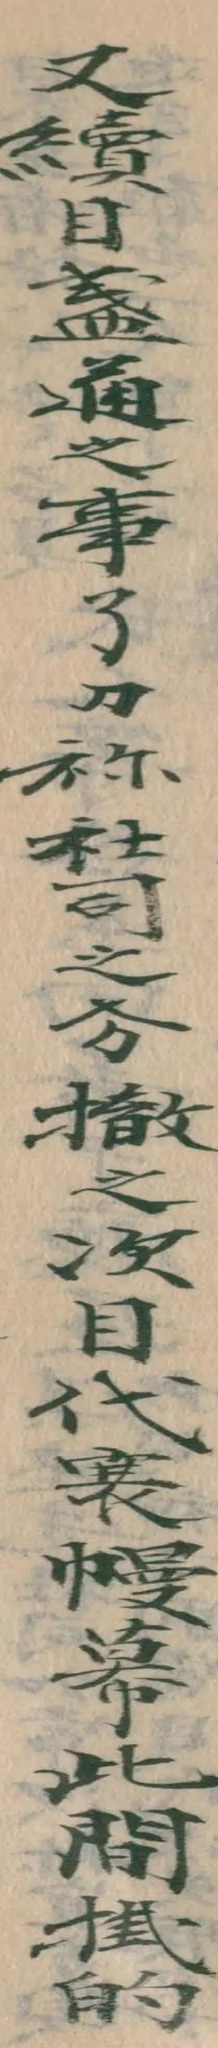又続目盞通之事了刀祢社司之分撤之次目代褰幔幕此間掛的
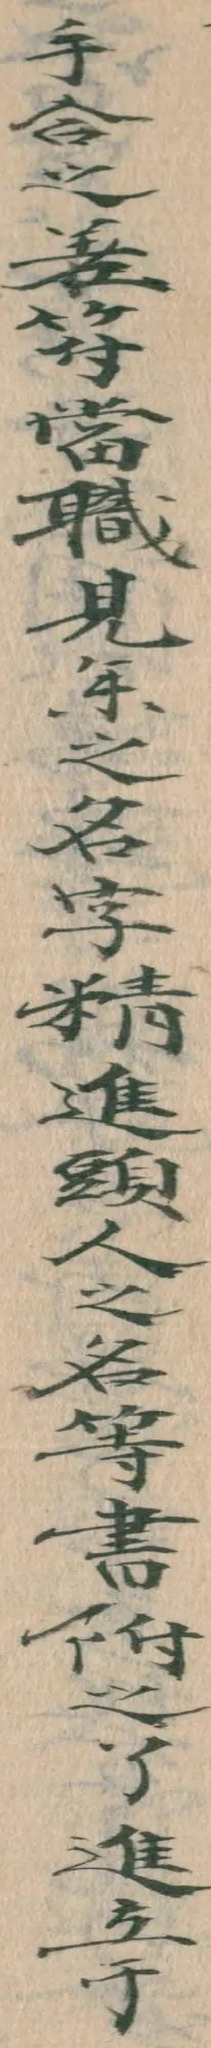手合之差符当職見参之名字精進頭人之名等書附之了進立于

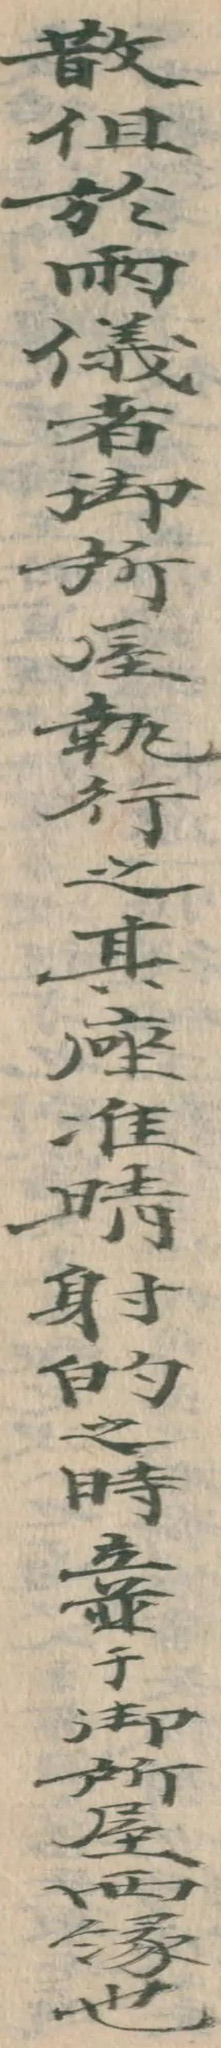散但於両儀者御所屋執行之其座准晴射的之時立並于御所屋西縁也
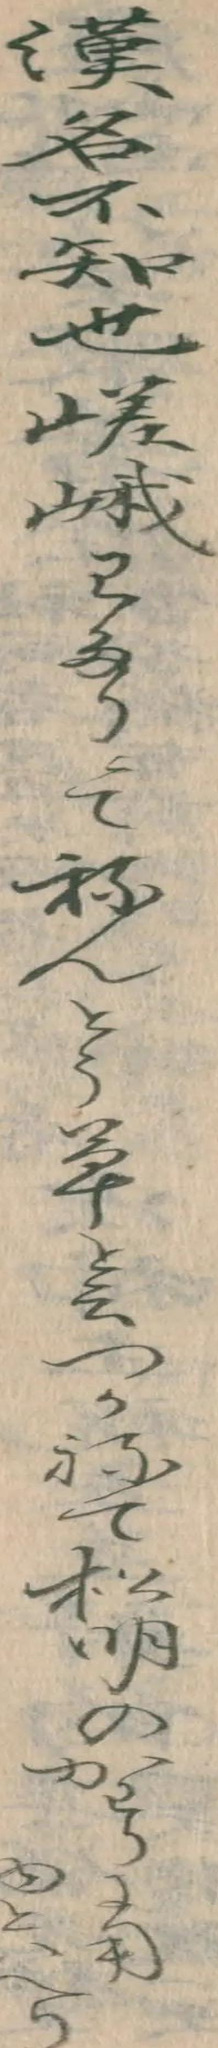漢名不知也嵯峨わたりニてねんとう草と云つかねて松明のかわりに用
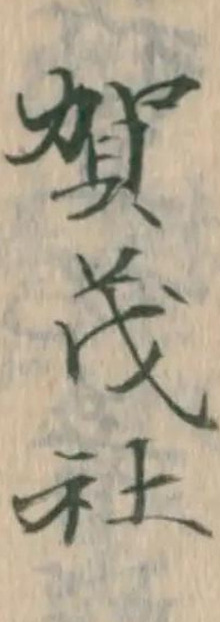賀茂社
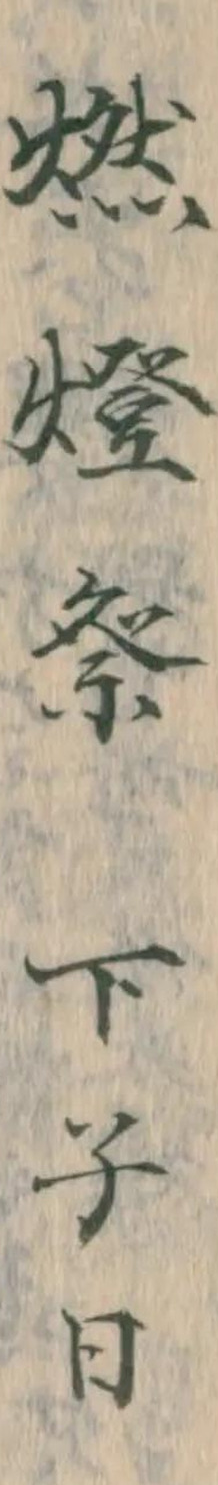燃燈祭下子日
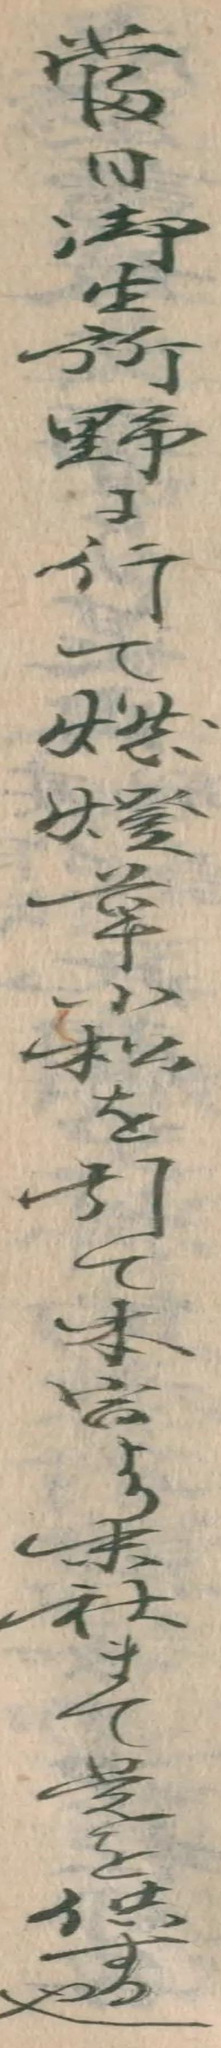当日御生所野に行て燃燈草小松を引て本宮より末社まて是を供する也
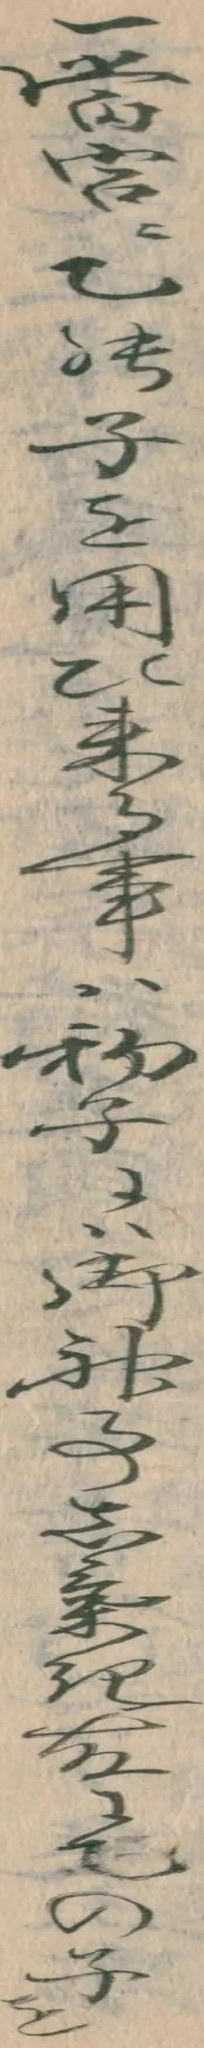一当宮ニ乙の子を用ひ来る事は初子には御神事しけ記故に乙の子を
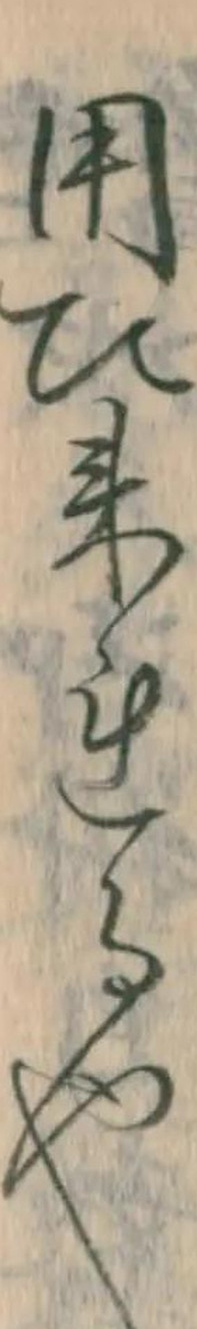用ひ来れる也
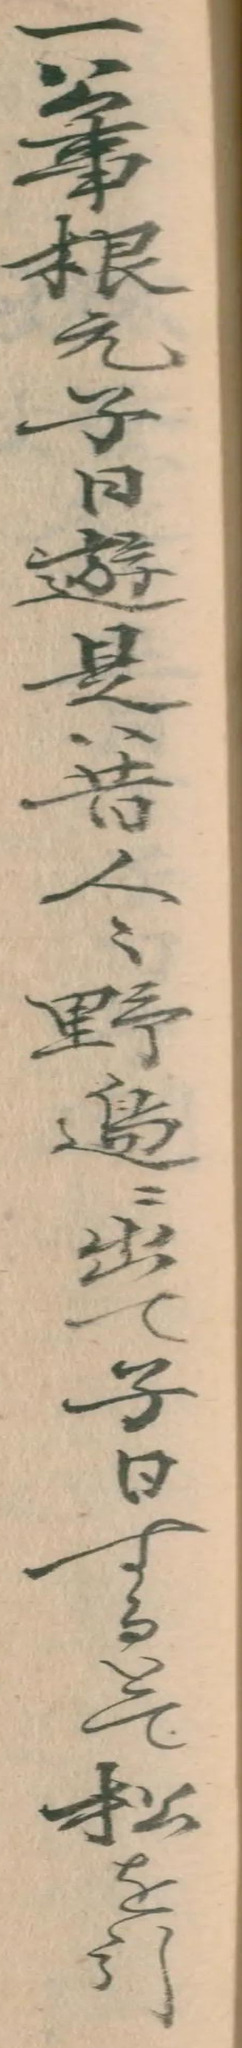一公事根元子日遊是は昔人々野辺ニ出て子日するとて松を引
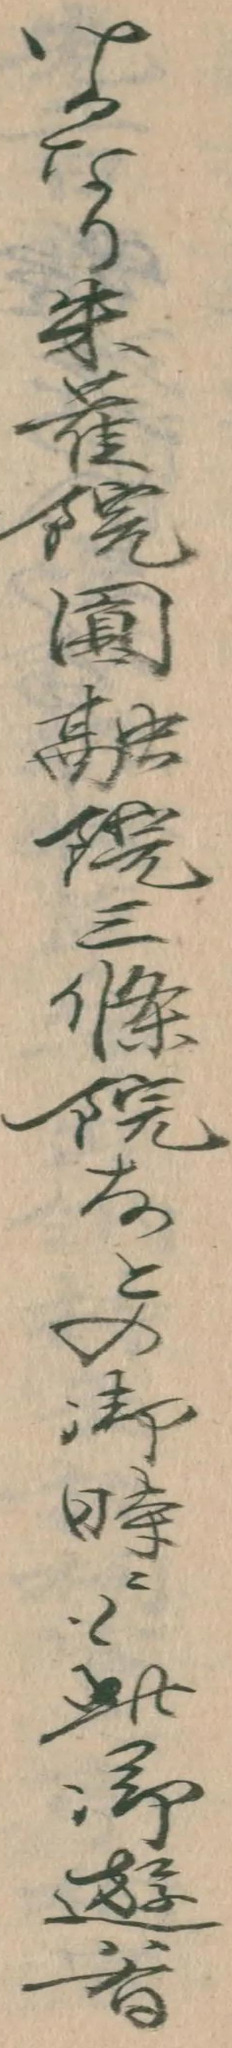けるなり朱雀院円融院三条院なとの御時ニも此御遊は有
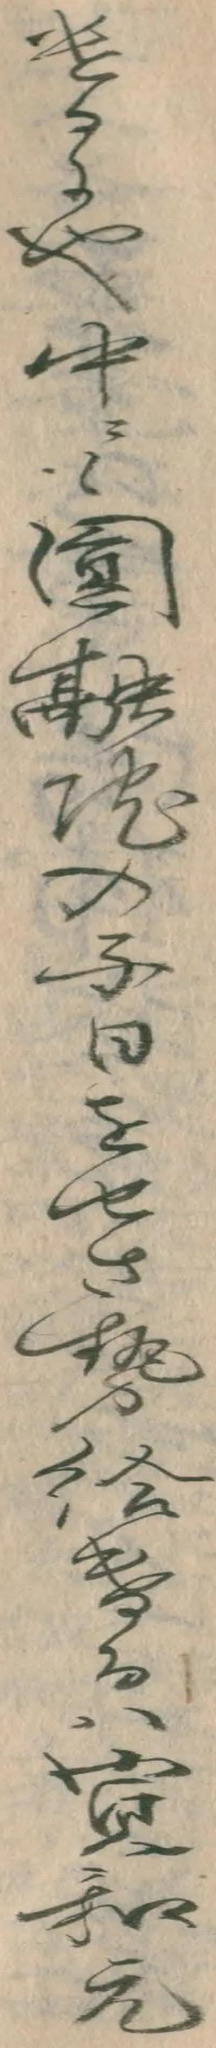けるにや中ニも円融院の子日をせさせ給けるは寛和元
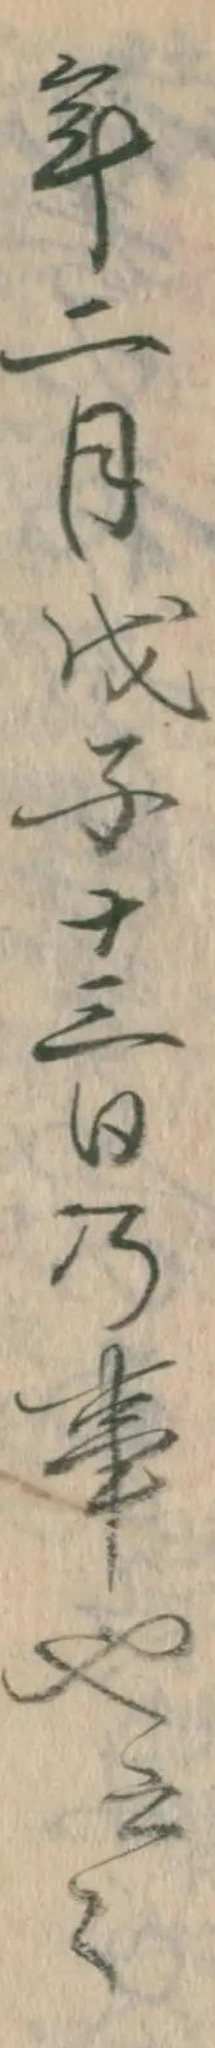年二月戊子十三日の事也云々
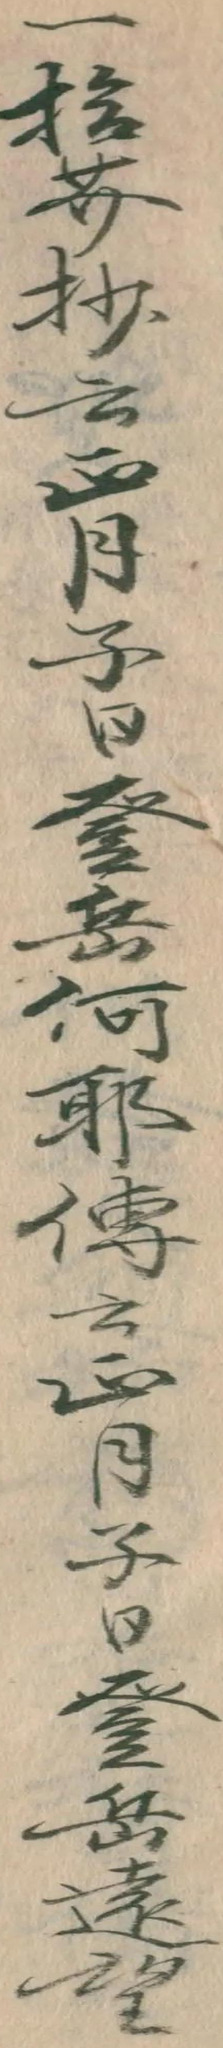一拾芥抄云正月子日登岳何耶伝云正月子日登岳遠望
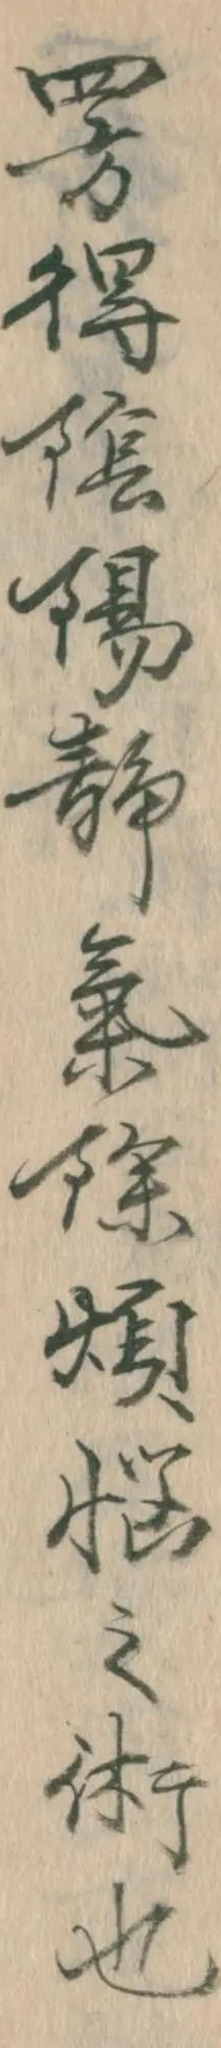四方得陰陽静気除煩悩之術也
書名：賀茂社記録. 第9冊
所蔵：国立国会図書館 National Diet Library, JAPAN
